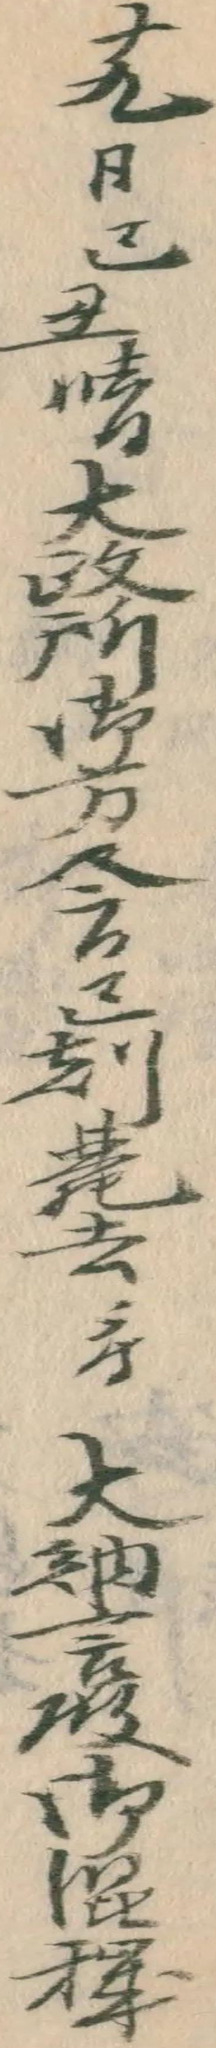十九日己丑晴大政所御方今日巳刻薨去ニ付大納言殿御混穢
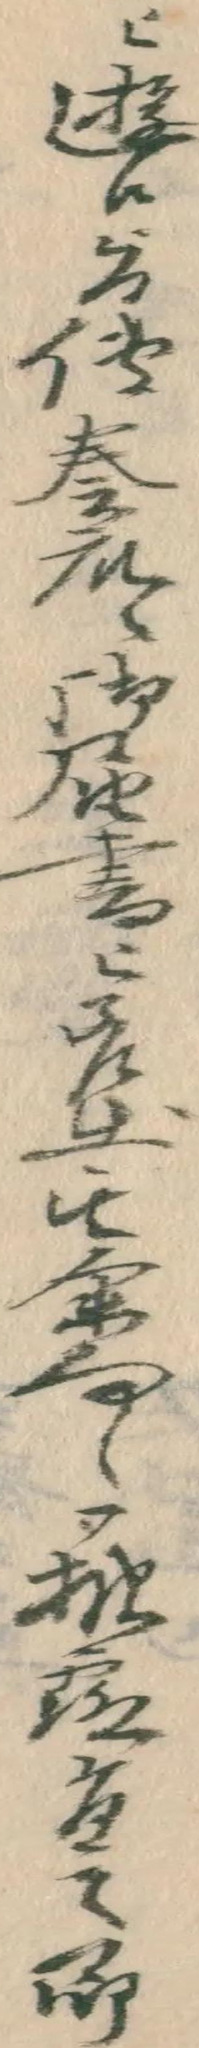被遊候旨傳奏衆へ御届書被差出其余向候御披露有之即
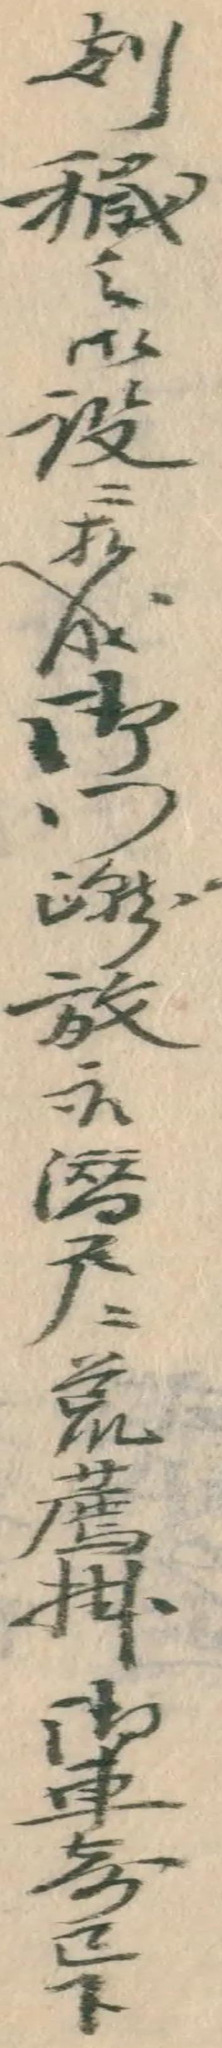刻穢之御役に相成御門蹴放取潜戸に荒薦掛御車寄已下
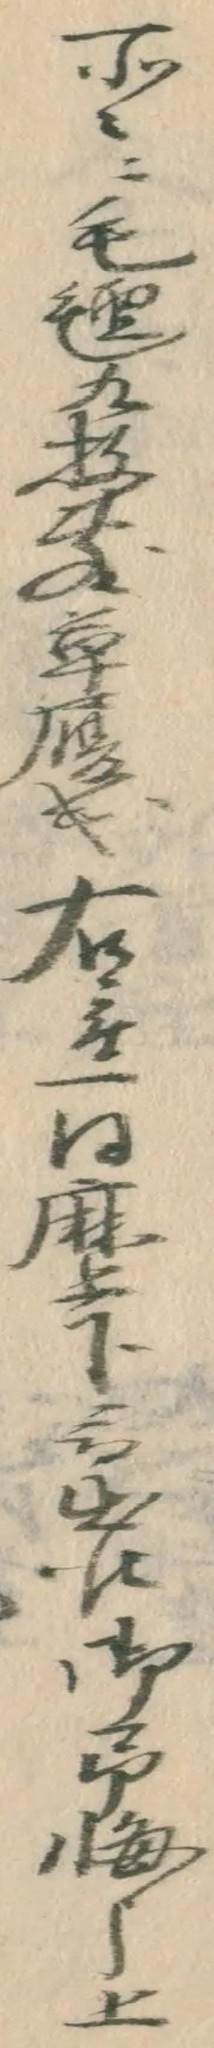所々ニ毛氈九枚敷草履き右ニ付一同麻上下ニ而出仕御弔悔申上
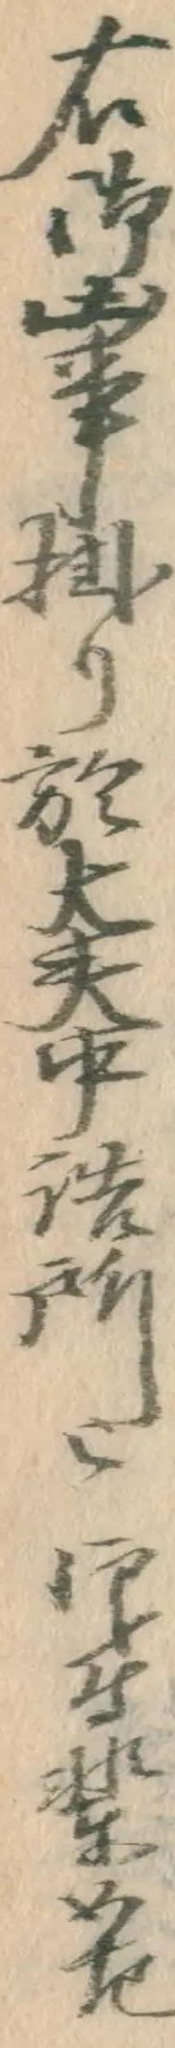右御凶事掛り於大夫中詰所被仰付輩如左

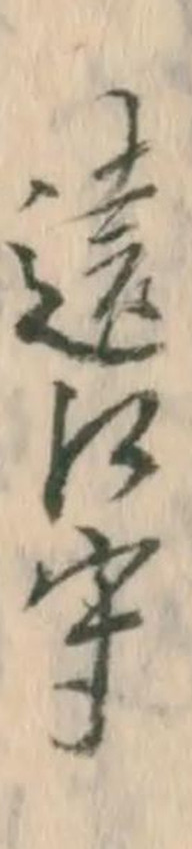遠江守
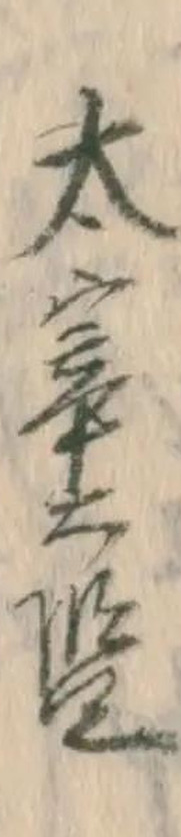太宰大監
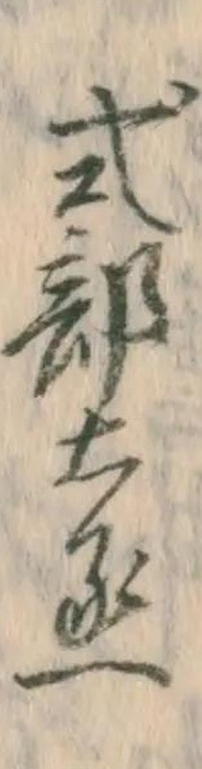式部大丞
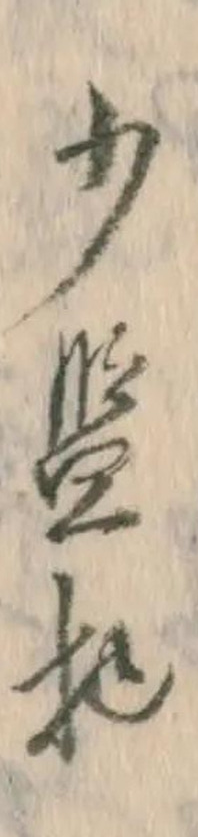少監物
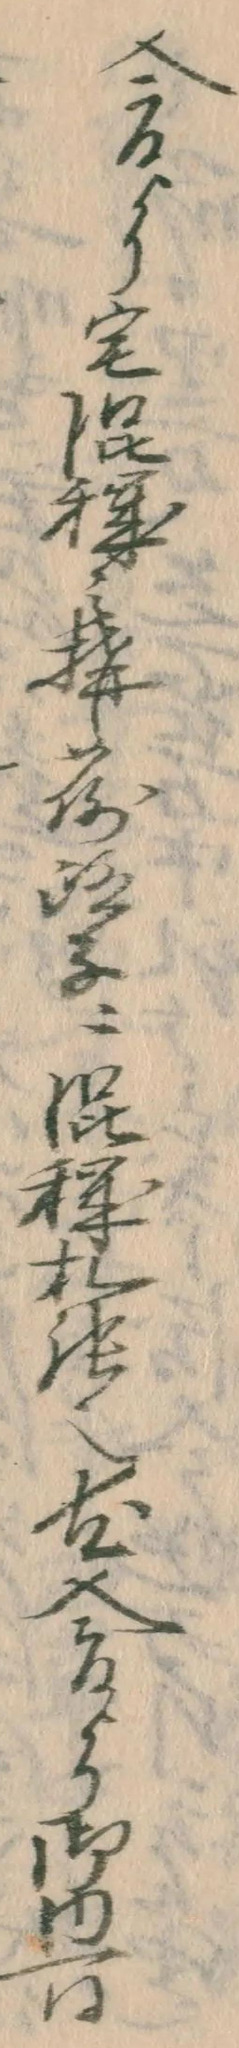今日より宅混穢之構如例政子ニ混穢札張也尤今日より御内一同
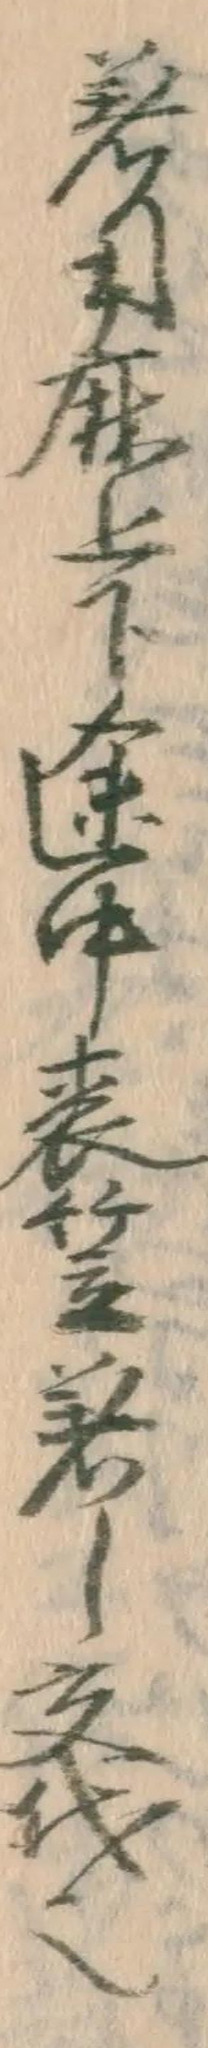着用麻上下途中裏笠着し交代也
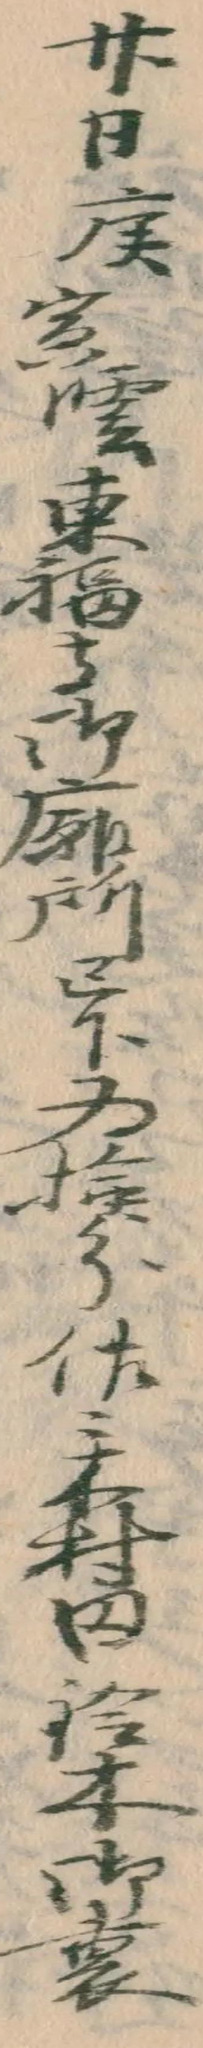廿日庚寅曇東福寺御廟所已下為検分佐々木村田鈴木御裏
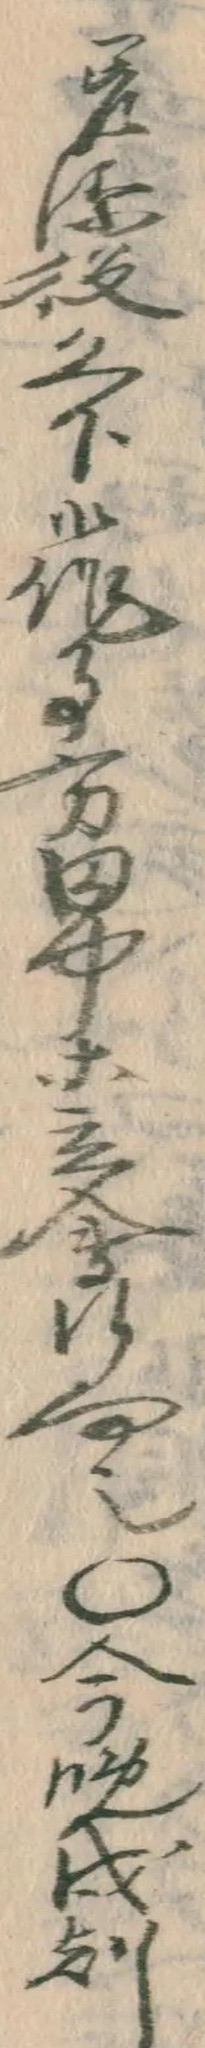差添役久下御作事方田中等立會行向也○今晩戌刻
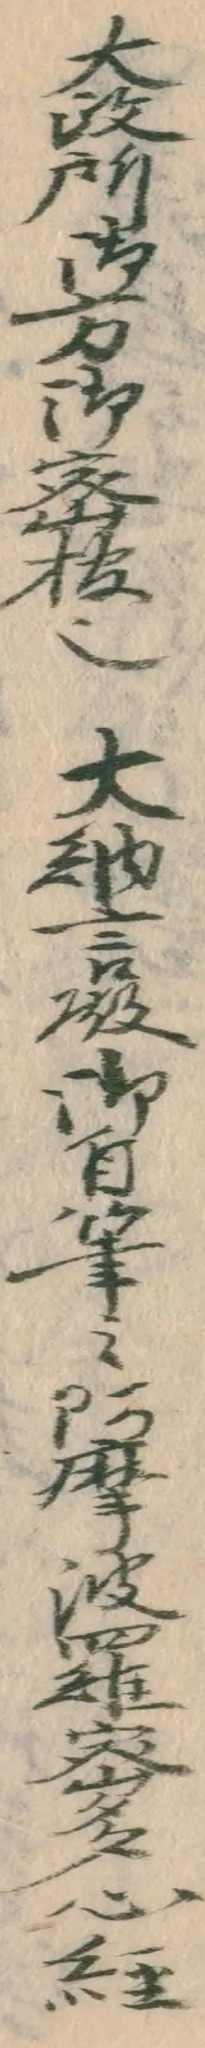大政所御方御密棺也大納言殿御自筆之阿摩波羅密多心経
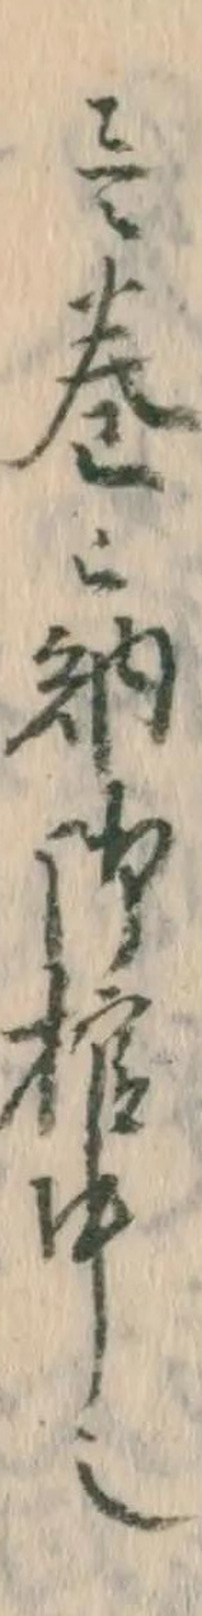壱巻被納御棺中也
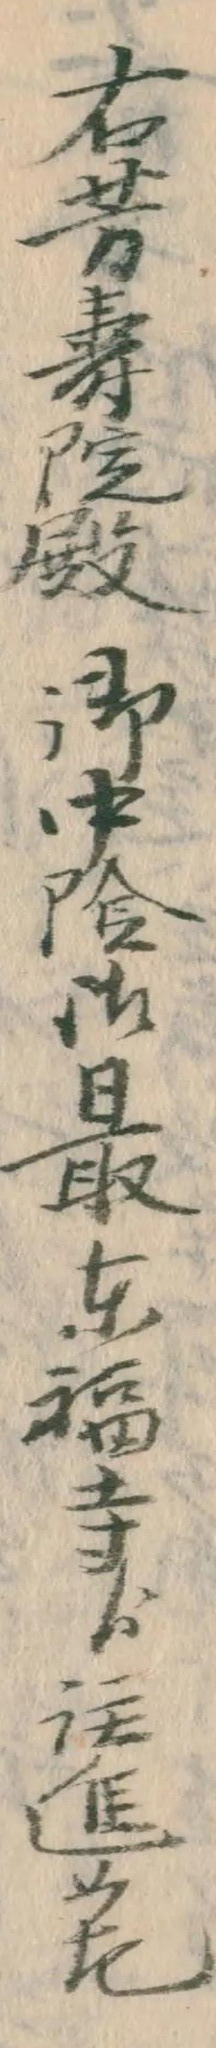右芳壽院殿御中陰御日取東福寺ゟ注進如左
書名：賀茂社記録. 第69冊
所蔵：国立国会図書館 National Diet Library, JAPAN
